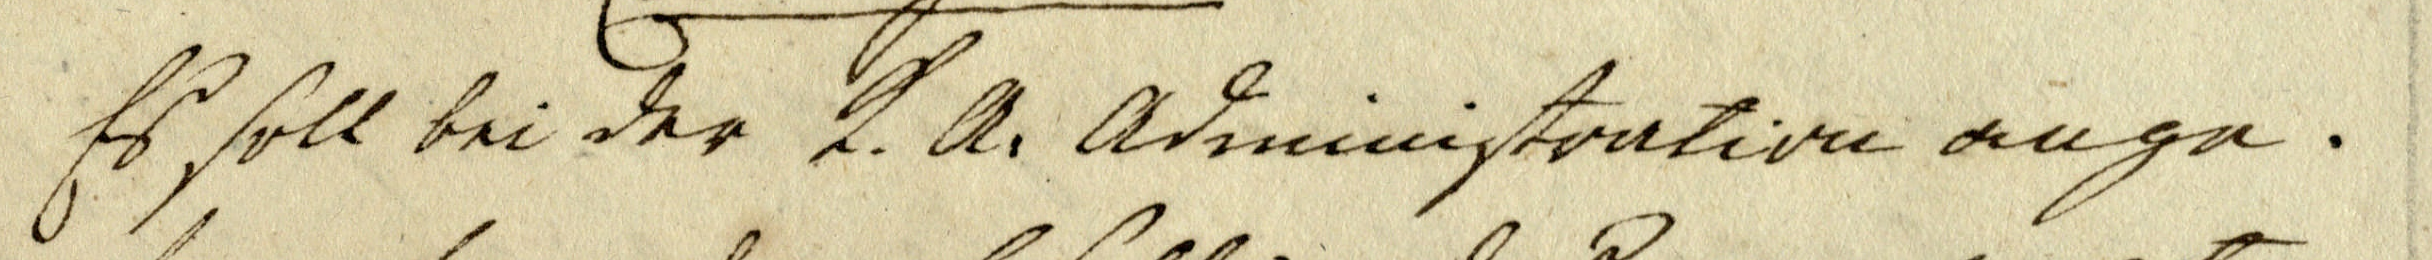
Es soll bei der K. A. Administration ange¬
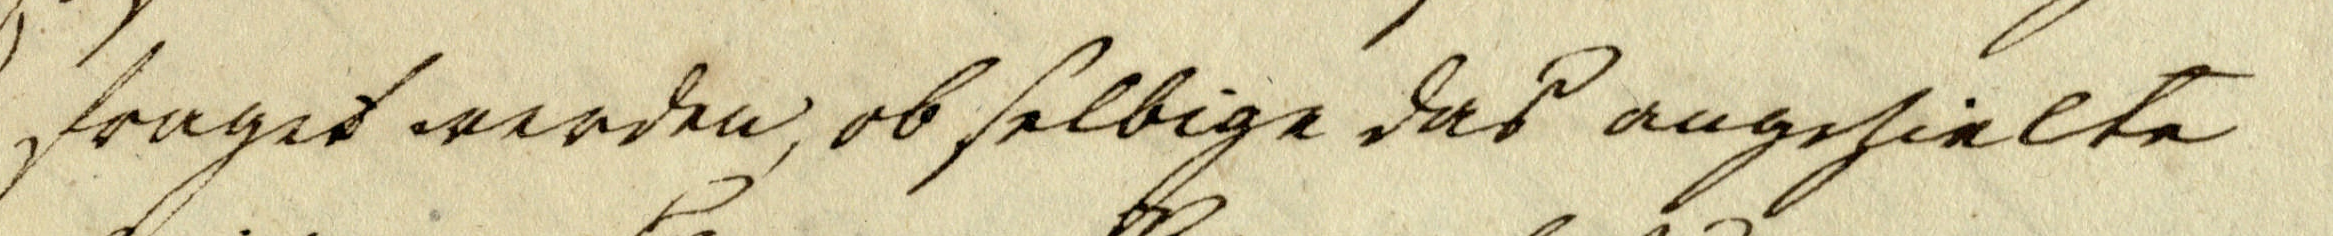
fraget werden, ob selbige das angezielte
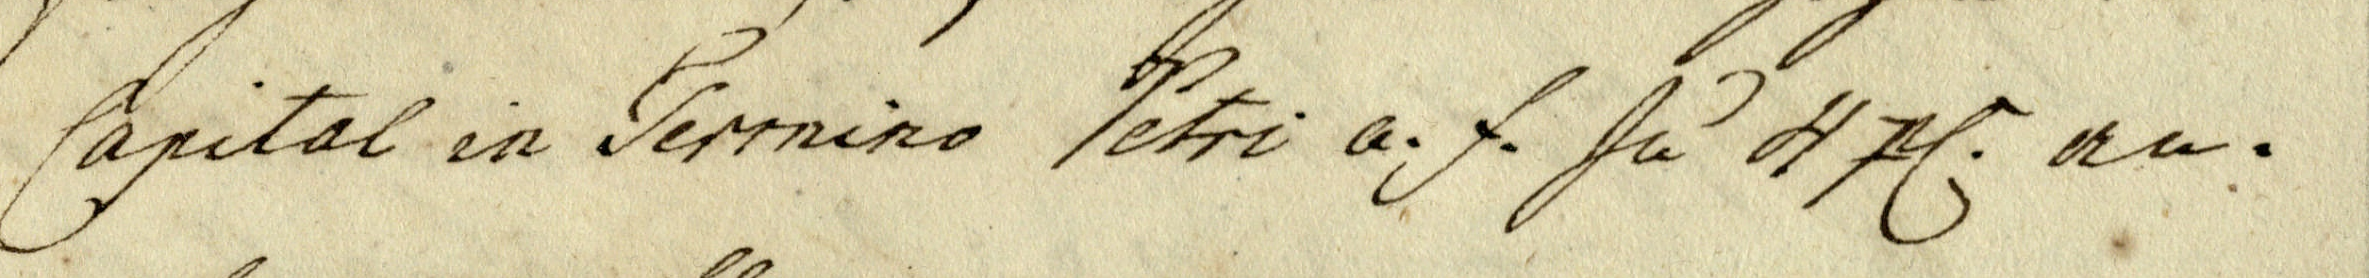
Capital in Termino Petri a. f. zu 4 pl. an¬
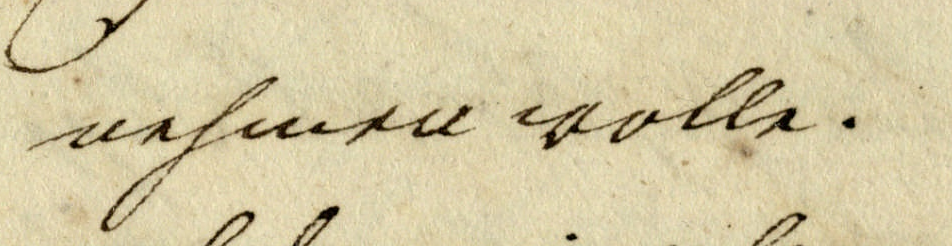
nehmen wolle.
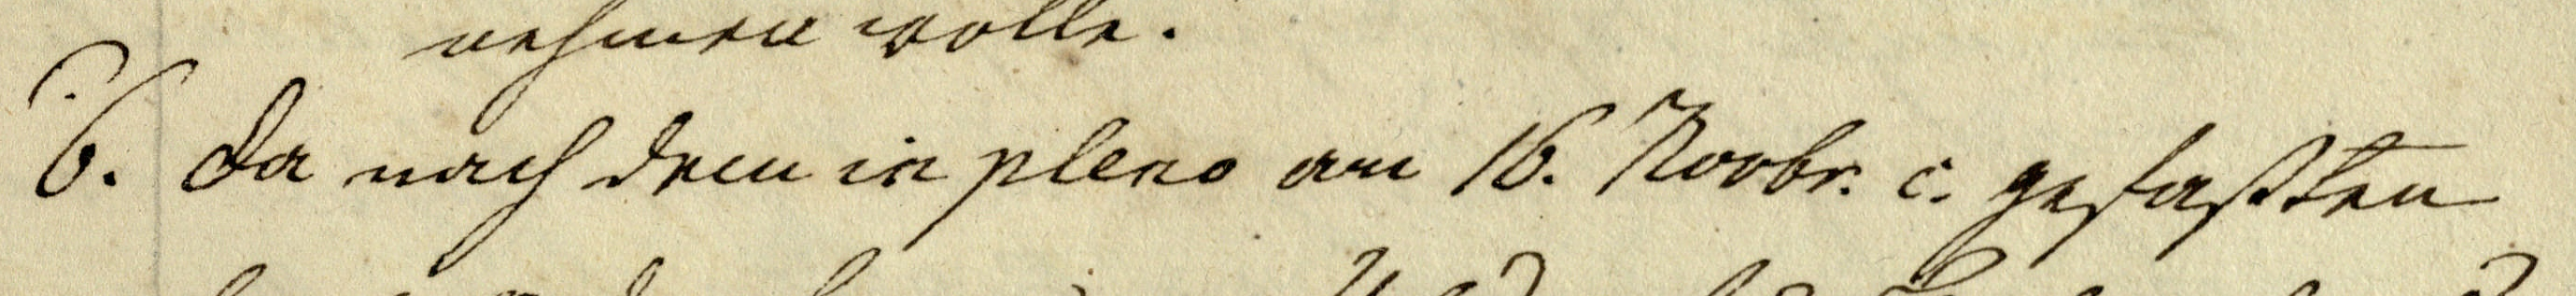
6. Da nach dem in pleno am 16. Novbr. c. gefaßten
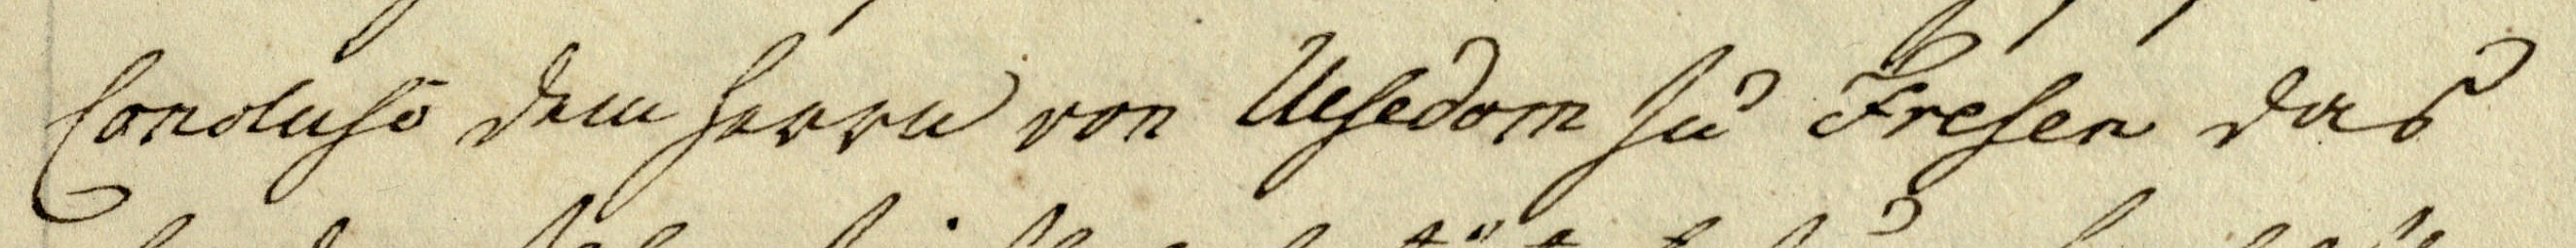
Concluso dem Herrn von Uesedom zu Fresen das
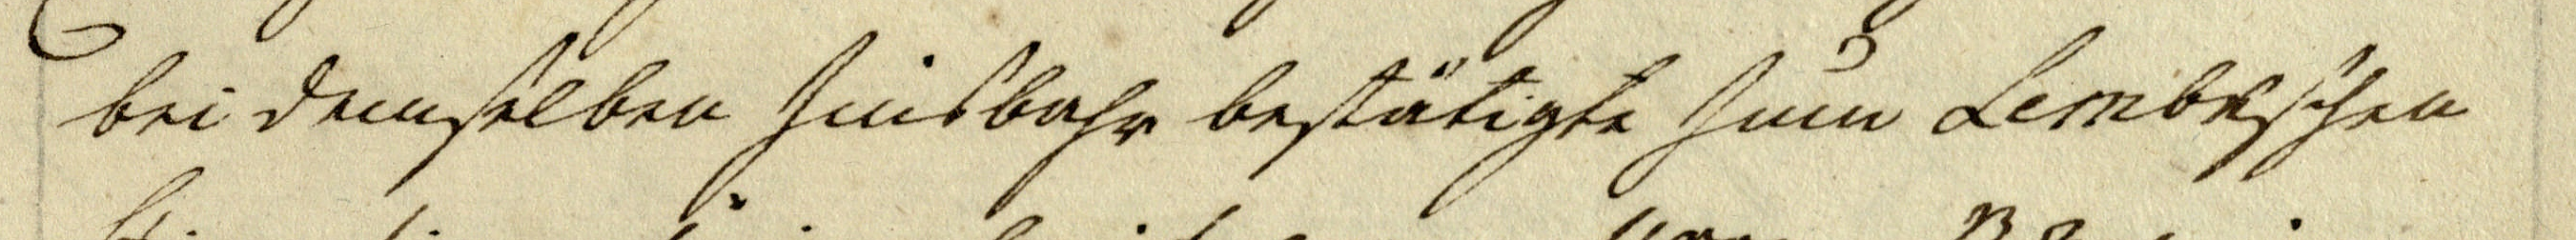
bei demselben zinsbahr bestätigte zum Lembkschen
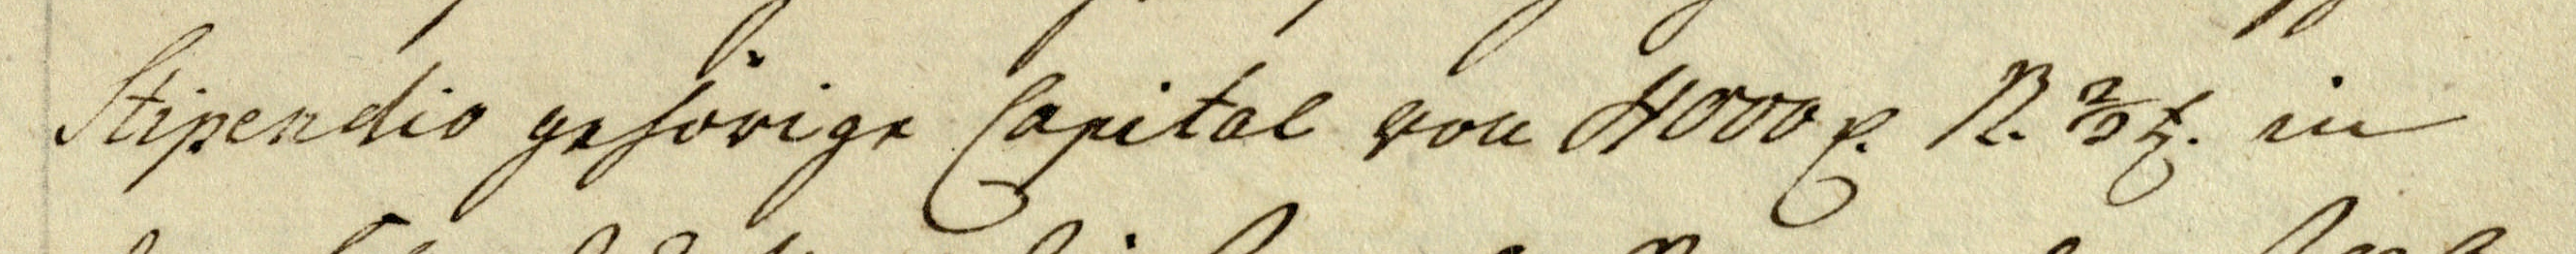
Stipendio gehörige Capital von 4000 l. N. ¾ h. in
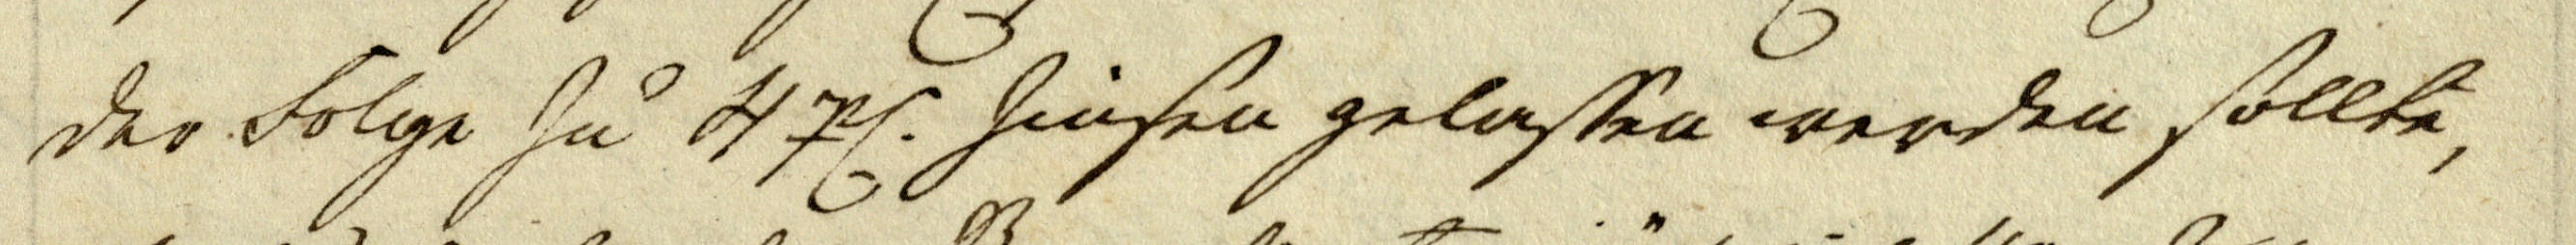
der Folge zu 4 pl. Zinsen gelassen werden sollte,
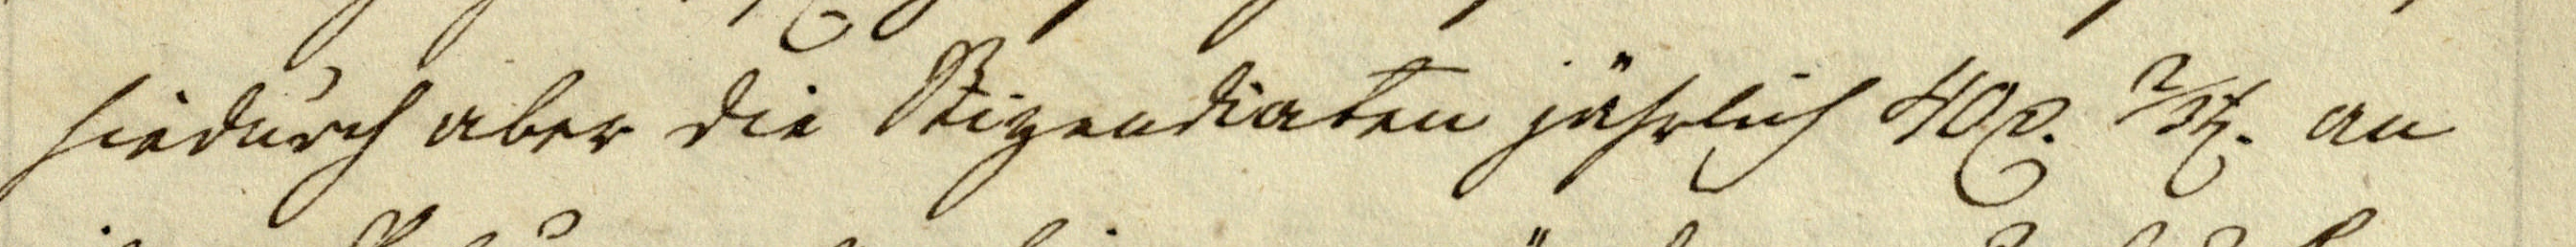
hiedurch aber die Stipendiaten jährlich 40 l. ¾ h. an
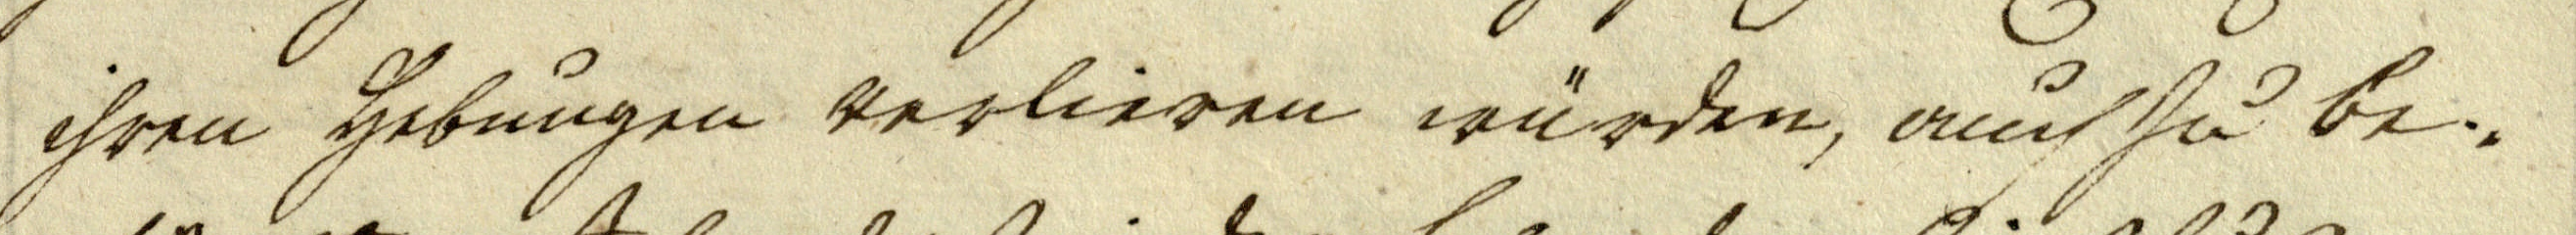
ihren Hebungen verlieren würden, auch zu be¬
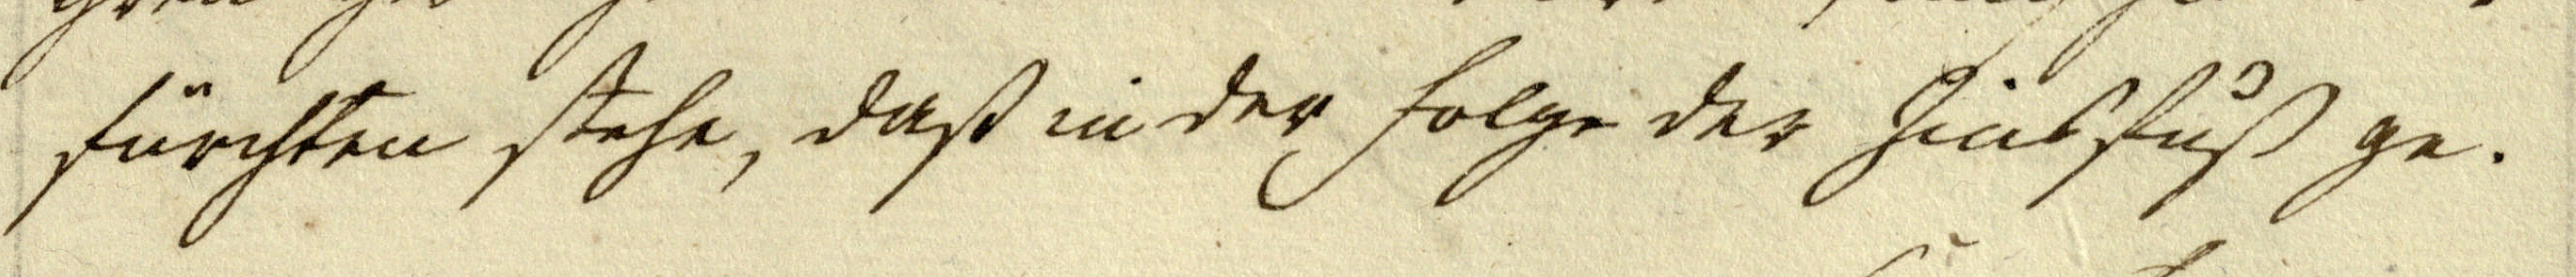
fürchten stehe, daß in der Folge der Zinsfuß ge¬
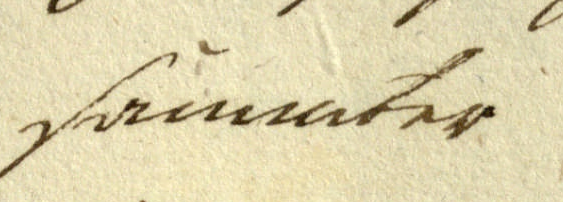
sammter
